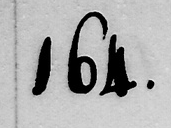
12.
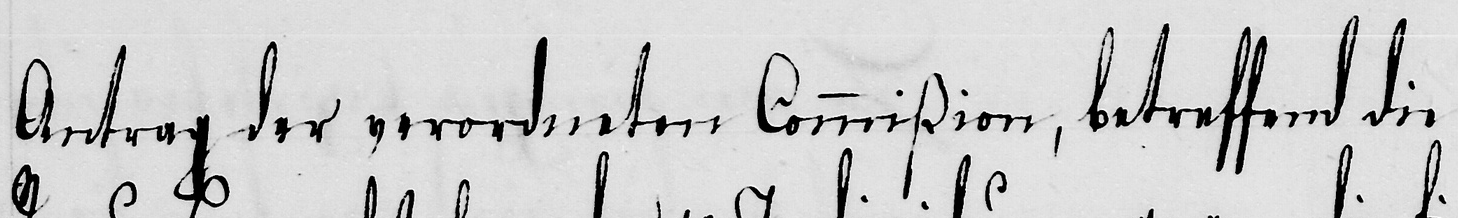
Antrag der verordneten Commißion, betreffend die
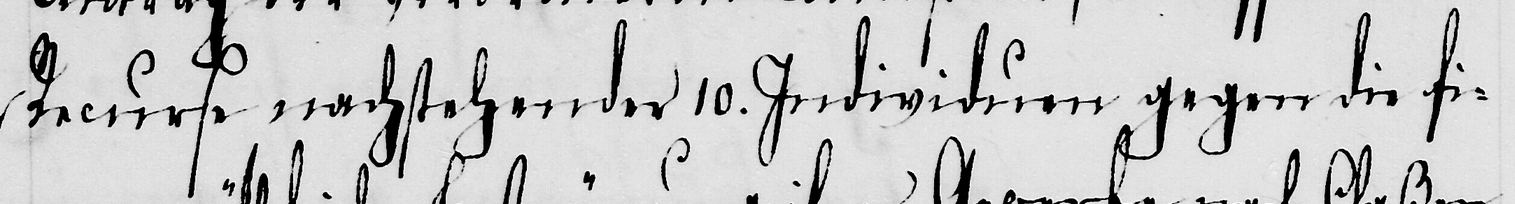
Recurse nachstehender 10. Individuen gegen die fi¬
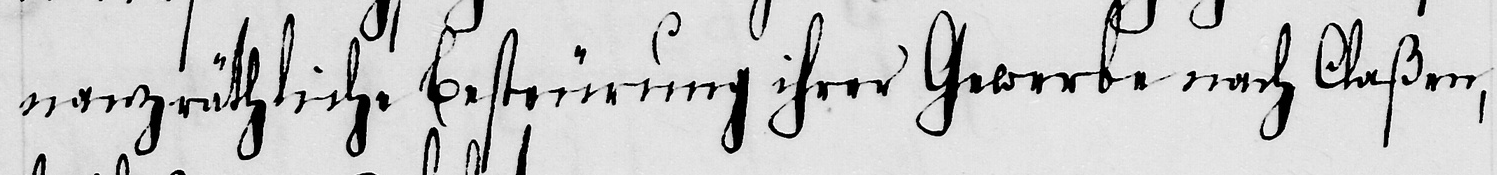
nanzräthliche Besteuerung ihrer Gewerbe nach Claßen,
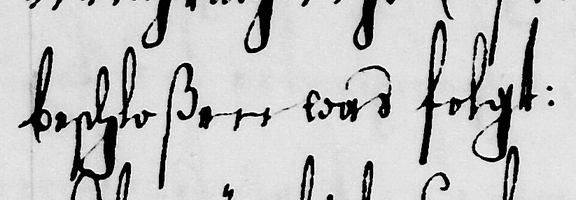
schloßen was folgt:
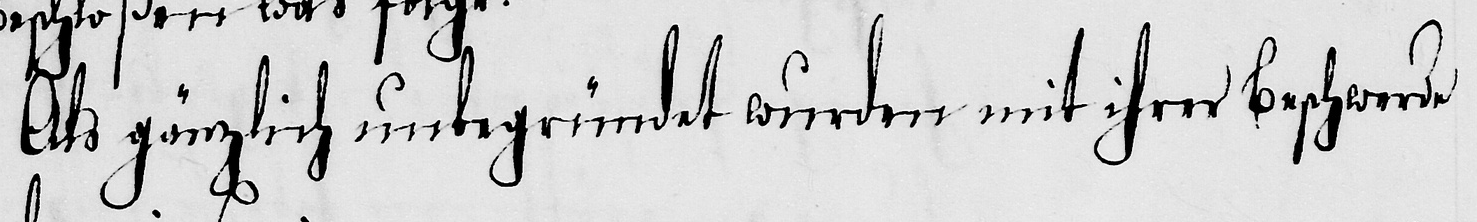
Als gänzlich unbegründet wurden mit ihrer Beschwerde
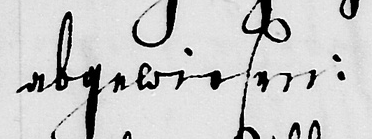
abgewiesen:
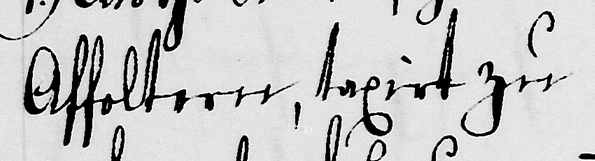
Affoltern, taxirt zu
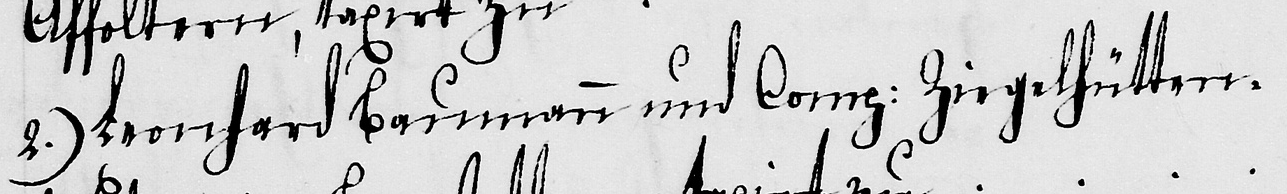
2.) Leonhard Baumann und Comp: Ziegelhütten¬
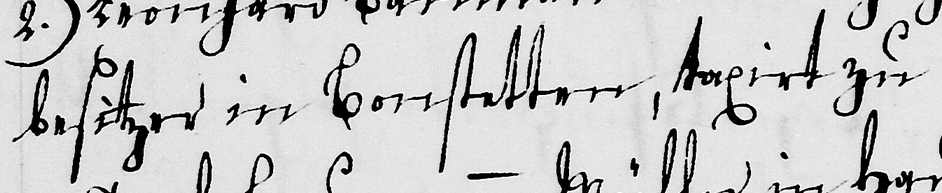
besitzer in Bonstetten, taxirt zu
